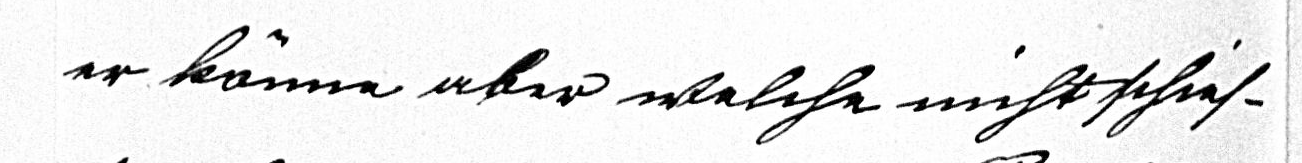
er könne aber welche nicht schies¬
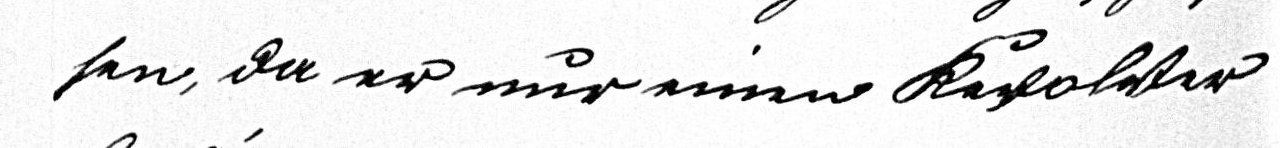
sen, da er nur einen Revolver
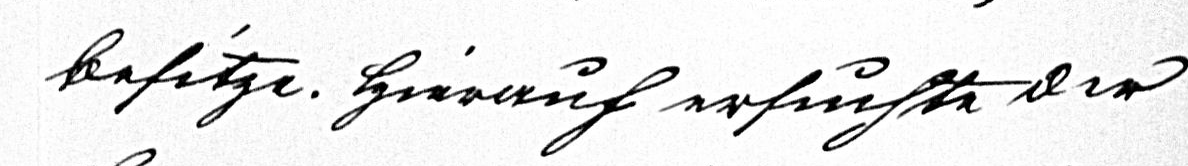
besitze. Hierauf ersuchte der
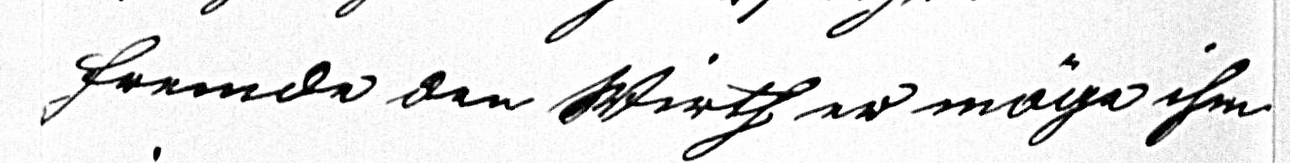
fremde den Wirth er möge ihm
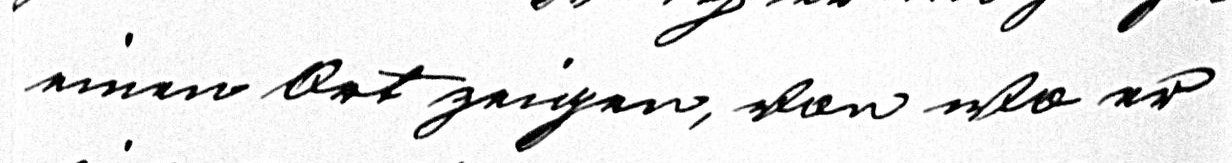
einen Oet zeigen, von wo er
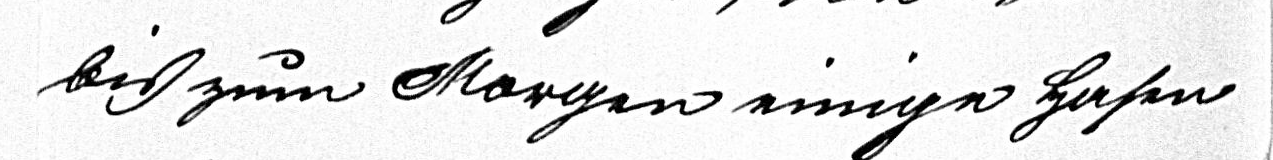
bis zum Morgen einige Hasen
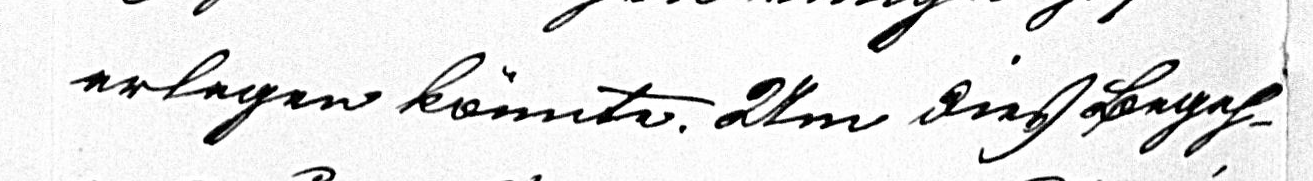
erlegen könnte. Um dies begeh¬
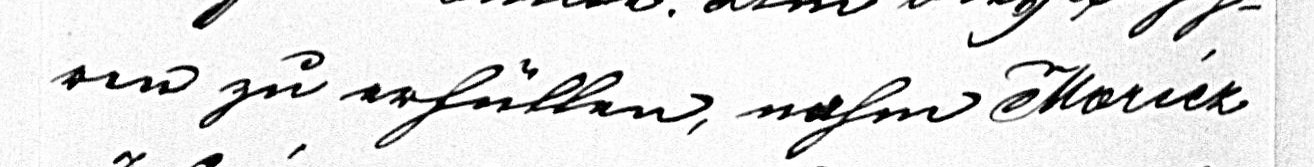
ren zu erhütten, nahm Moricz
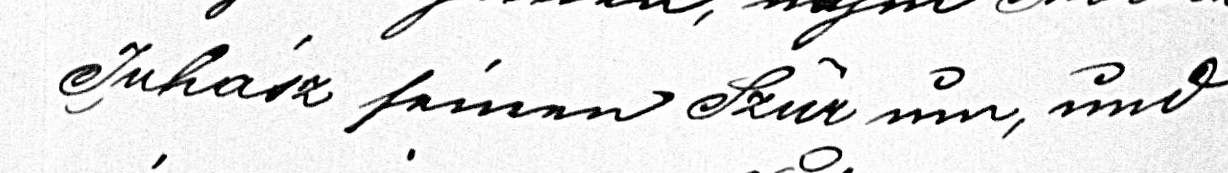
Juhász seinen Szur um, und
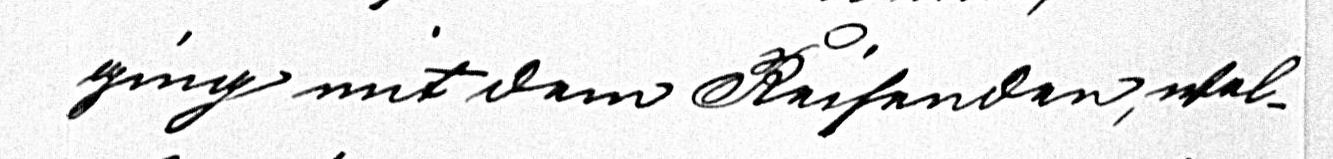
ging mit dem Reisenden, wel¬
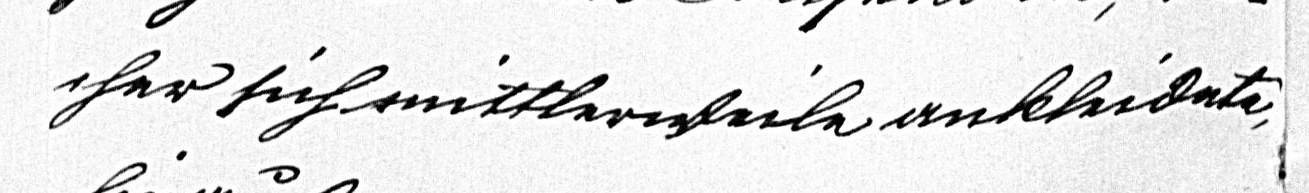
cher sich mittlerweile ankleidete,
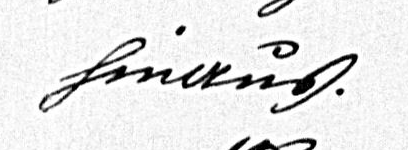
hinaus.
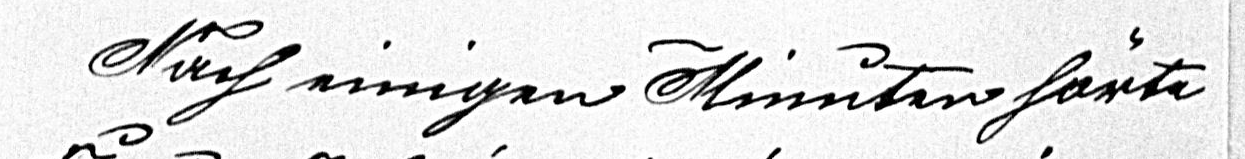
Nach einigen Minuten hörte
